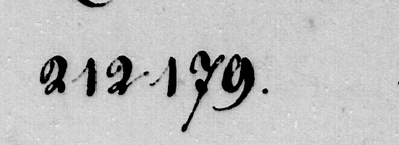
212179.
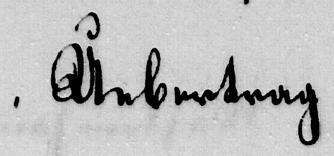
Uebertrag
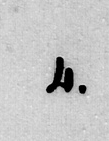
4.
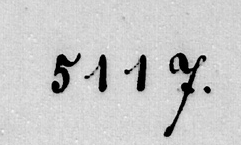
5117.
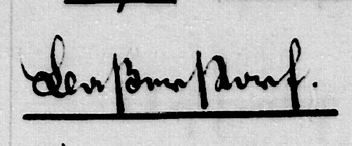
Baßersdorf.
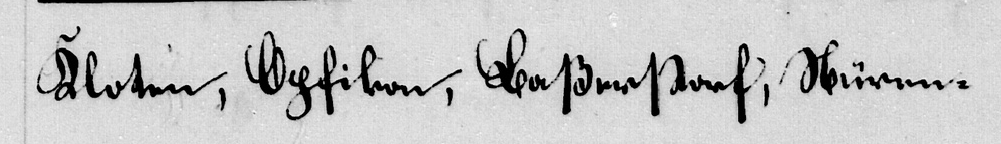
Kloten, Opfikon, Baßersdorf, Nüren¬
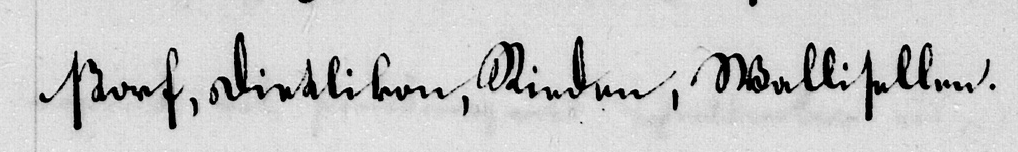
sdorf, Dietlikon, Rieden, Wallisellen.
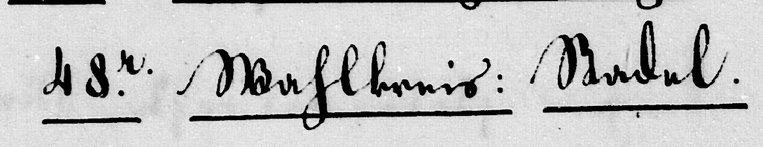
48.r. Wahlkreis: Stadel.
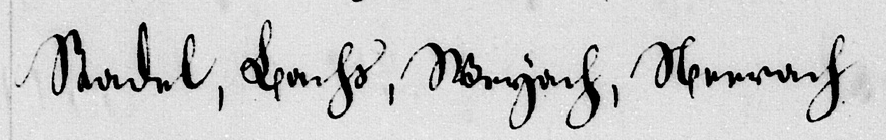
Stadel, Bachs, Weyach, Neerach
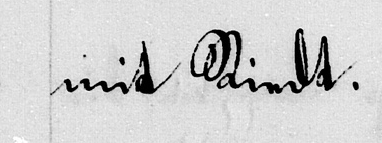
mit Riedt.
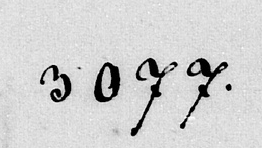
3077.
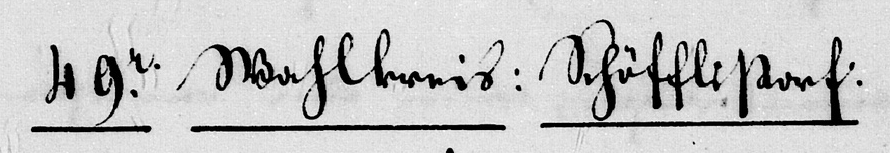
49.r. Wahlkreis: Schöfflisdorf.
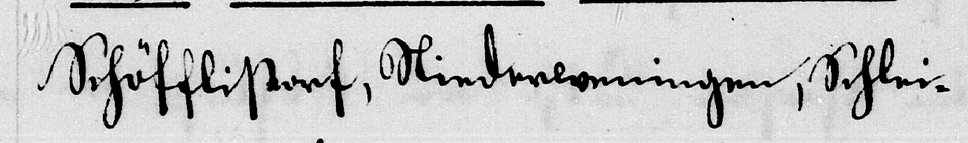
Schöfflisdorf, Niederweningen, Schlei¬
